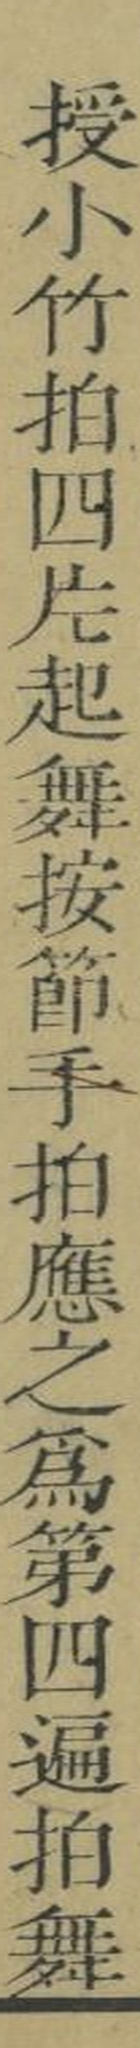授小竹拍四片起舞按節手拍應之爲第四遍拍舞
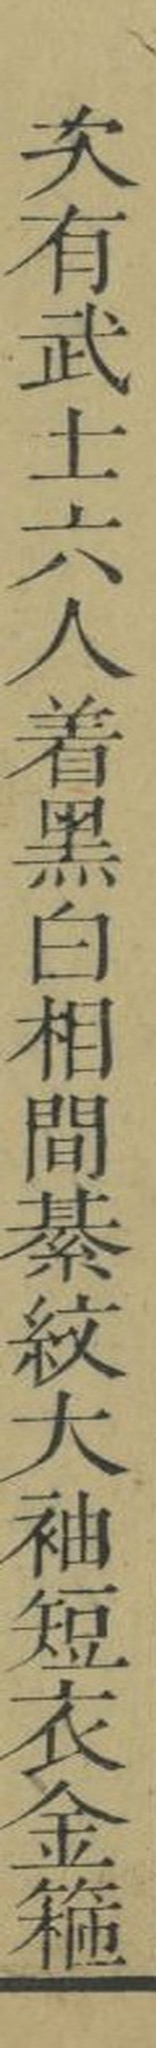次有武士六人着黑白相間綦紋大袖短衣金篐
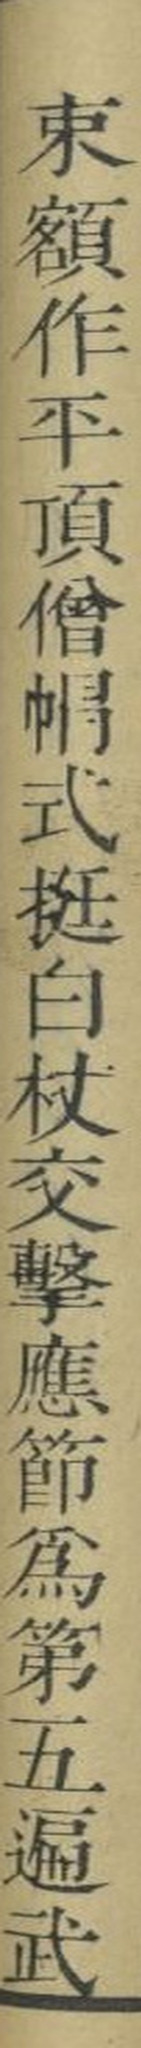束額作平頂僧帽式挺白杖交擊應節爲第五遍武
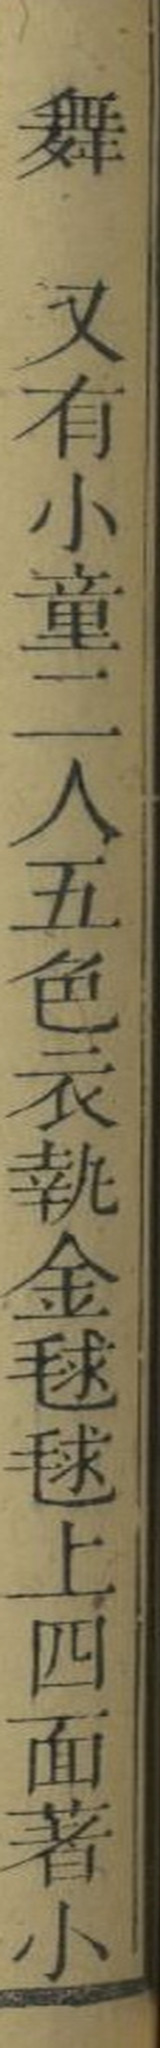舞又有小童二人五色衣執金毬毬上四面著小
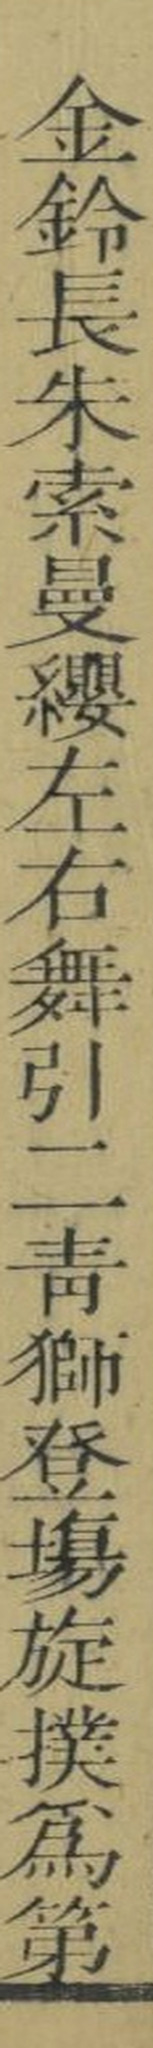金鈴長朱索曼纓左右舞引二靑獅登塲旋撲爲第
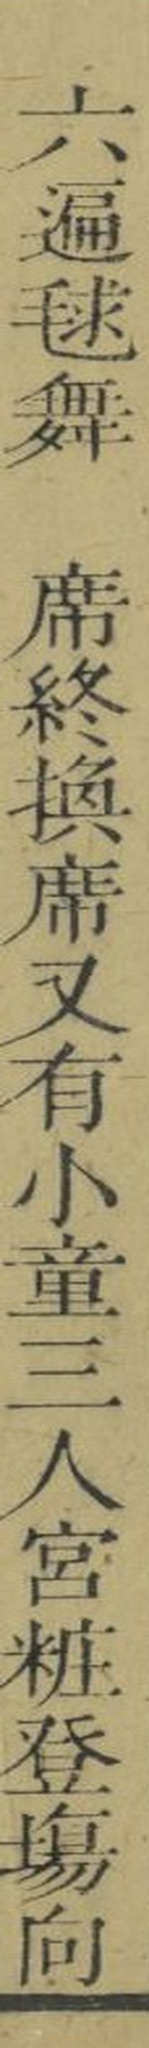六遍毬舞席終換席又有小童三人宮粧登塲向
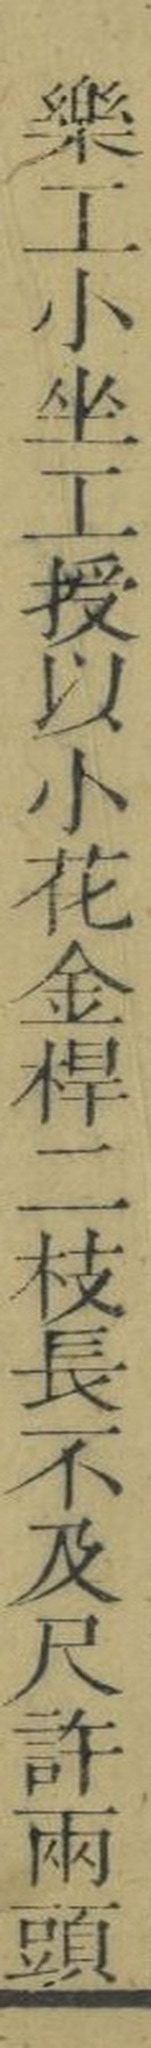樂工小坐工授以小花金桿二枝長不及尺許兩頭
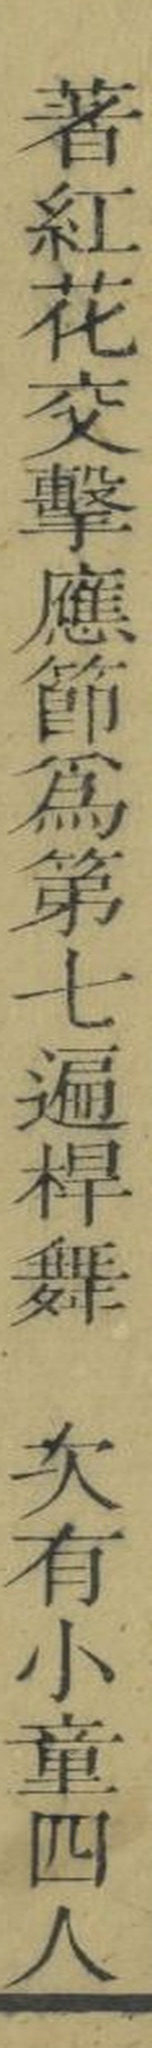著紅花交擊應節爲第七遍桿舞次有小童四人
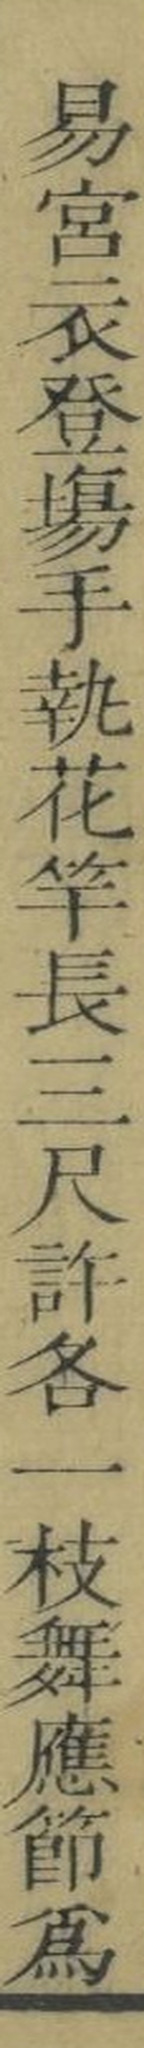易宮衣登塲手執花竿長三尺許各一枝舞應節爲
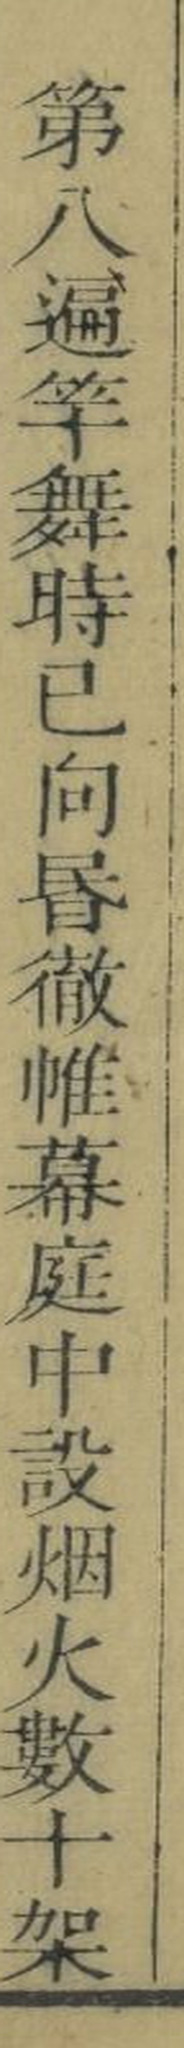第八遍竿舞時巳向昬徹帷幕庭中設烟火數十架
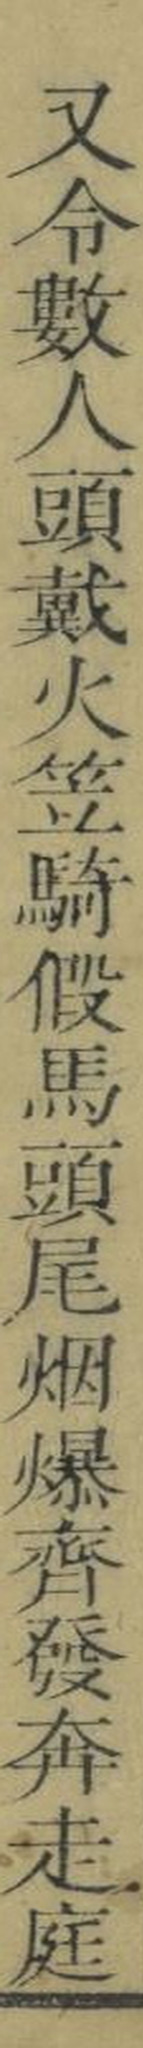又令數人頭戴火笠騎假馬頭尾烟爆齊發奔走庭
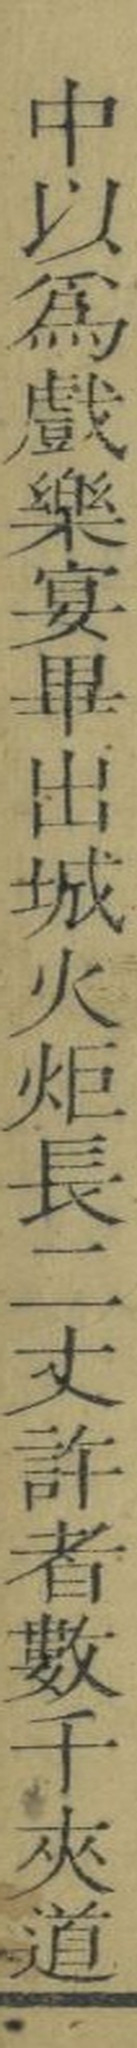中以爲戲樂宴畢出城火炬長二丈許者數千夾道

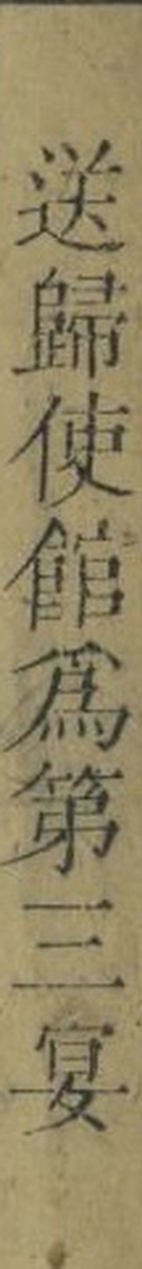送歸使館爲第三宴

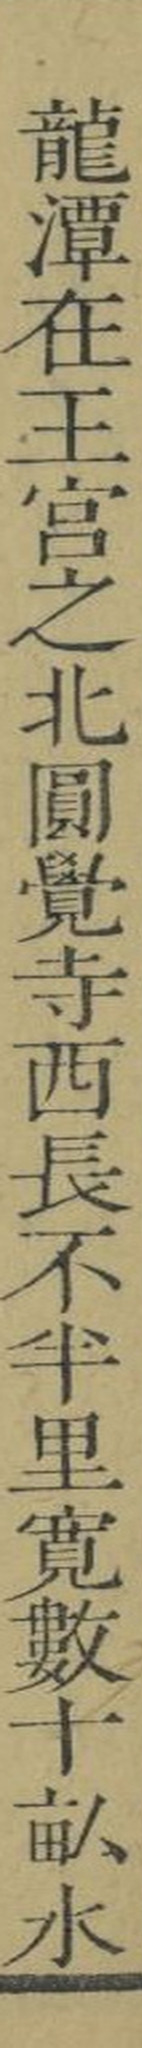龍潭在王宫之北圓覺寺西長不半里寛數十畒水
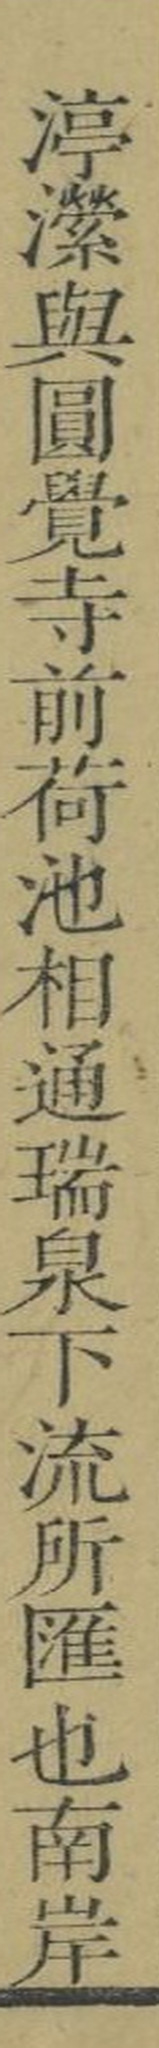渟瀠與圓覺寺前荷池相通瑞泉下流所匯也南岸
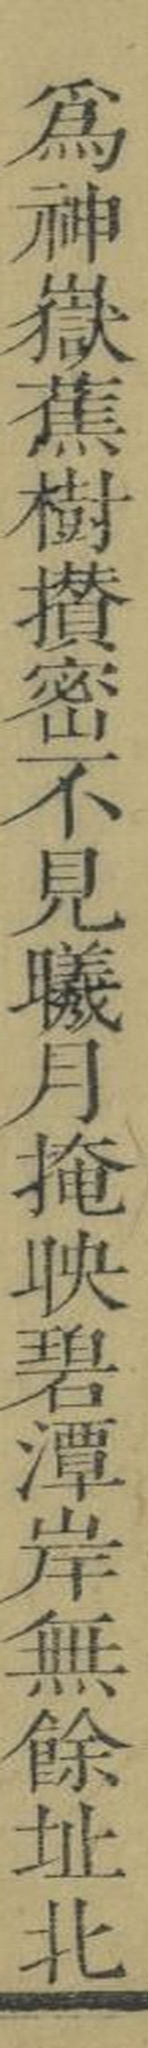爲神嶽蕉樹攅密不見曦月掩映碧潭岸無餘址北
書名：中山伝信録 巻二
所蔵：University of the Ryukyus Library
